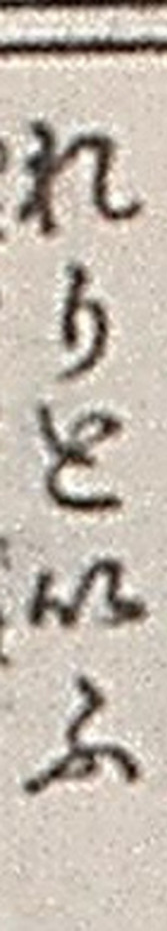れりといふ
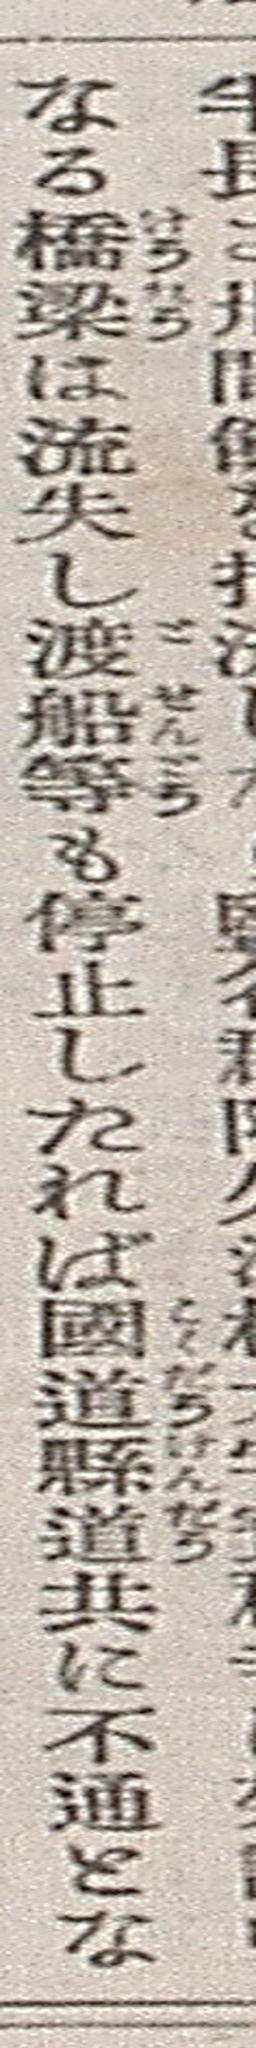なる橋梁は流失し渡船等も停止したれば国道県道共に不通とな
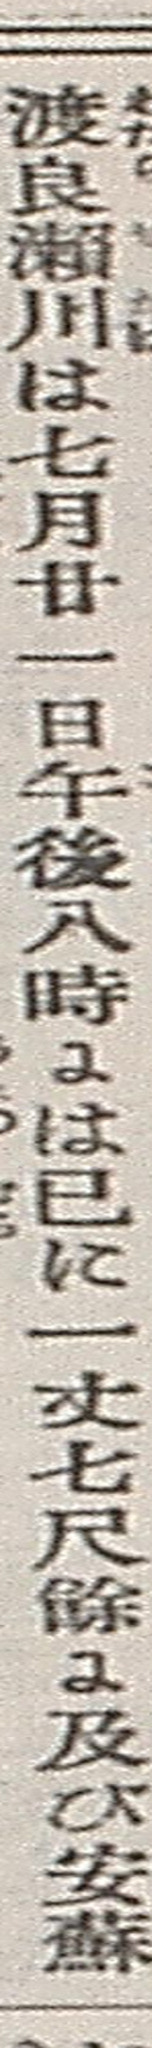渡良瀬川は七月廿一日午後八時には已に一丈七尺餘に及び阿蘇
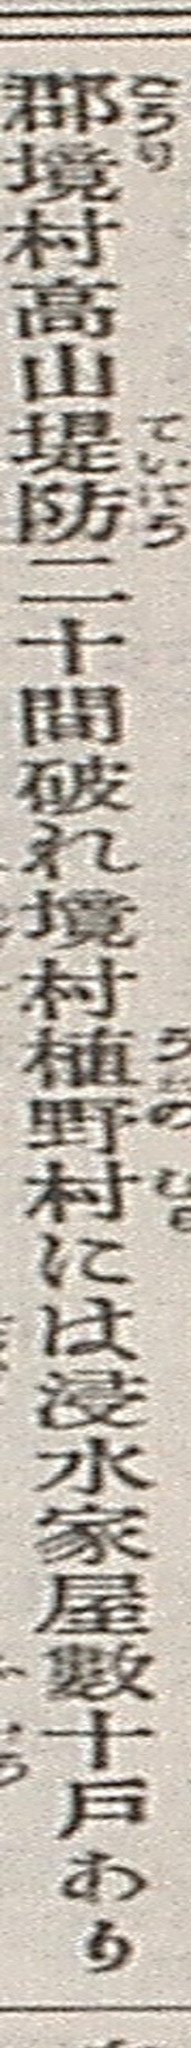郡境村高山堤防二十間破れ境村植野村には浸水家屋数十戸あり
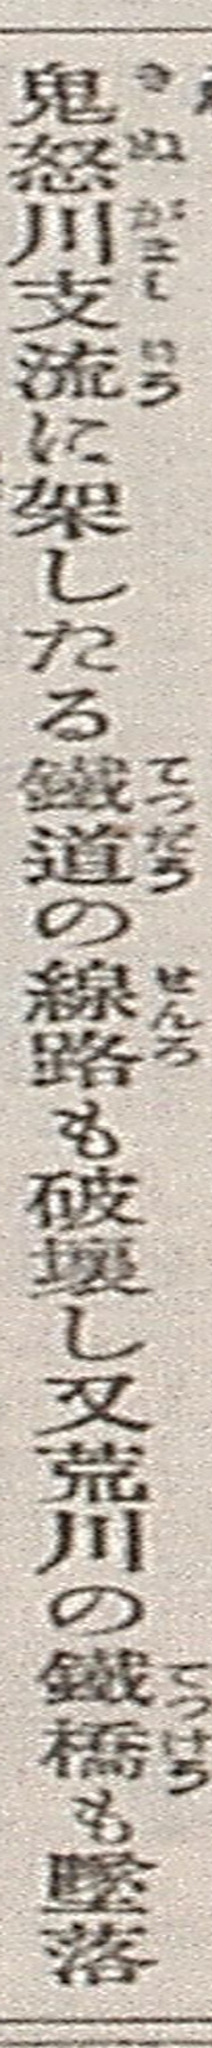鬼怒川支流に架したる鉄道の線路も破壊し又荒川の鉄橋も墜落
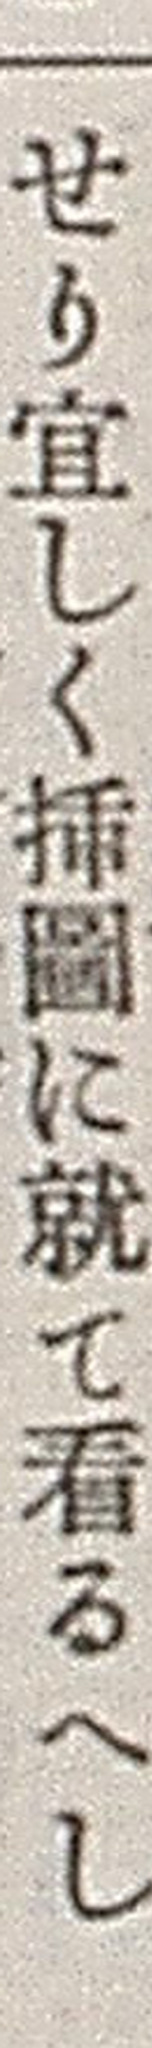せり宜しく挿圖に就て看るへし
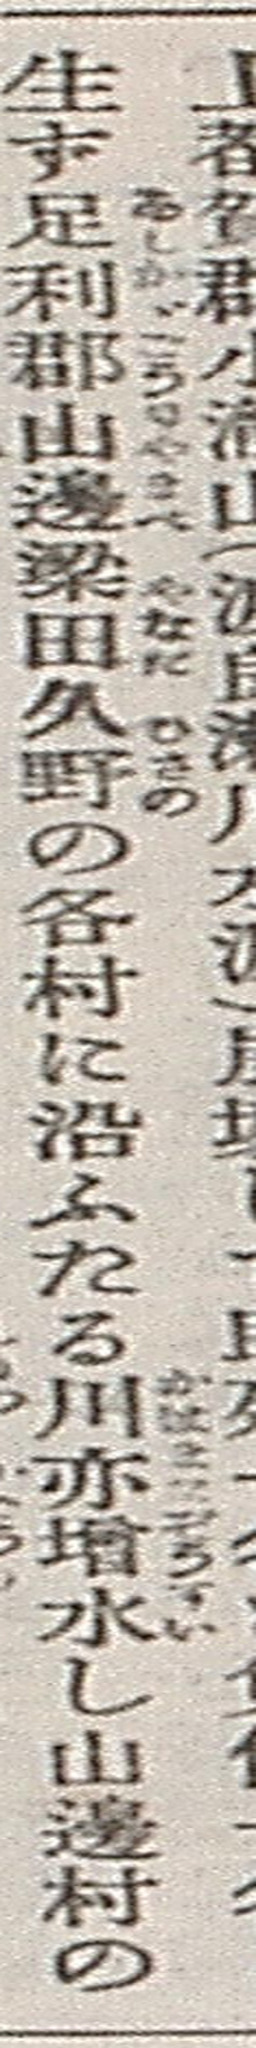生ず足利郡山辺梁田久野の各村に沿ふたる川亦増水し山辺村の
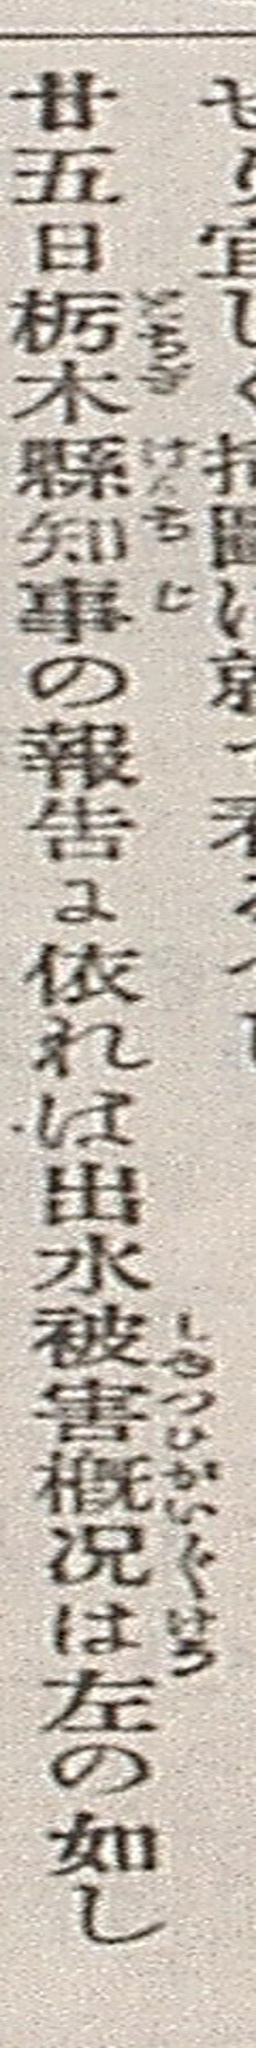廿五日栃木県知事の報告に依れば出水被害概況は左の如し
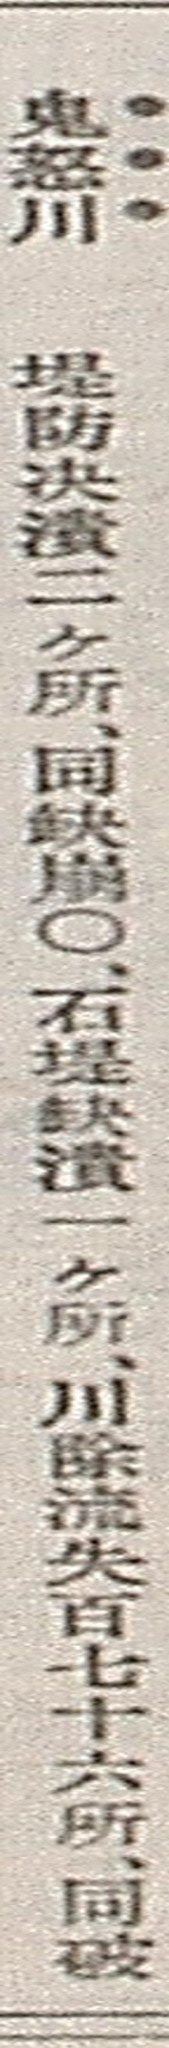鬼怒川堤防决潰二ヶ所、同缺崩０、石提缺潰一ヶ所、川除流失百七十六所、同破
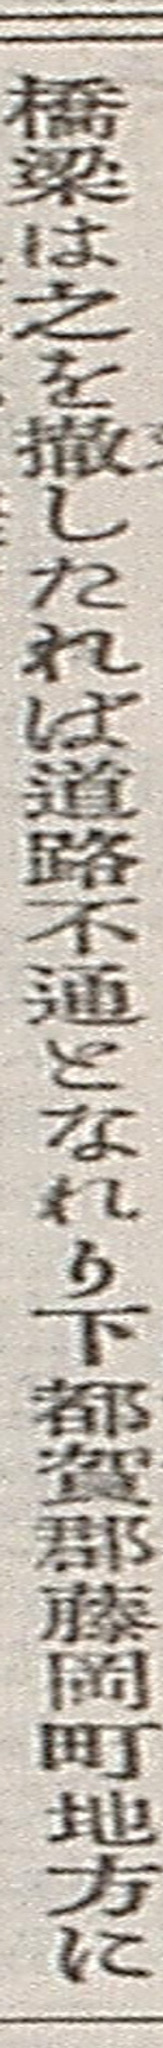橋梁は之を撤したれば道路不通となれり下都賀郡藤岡町地方に
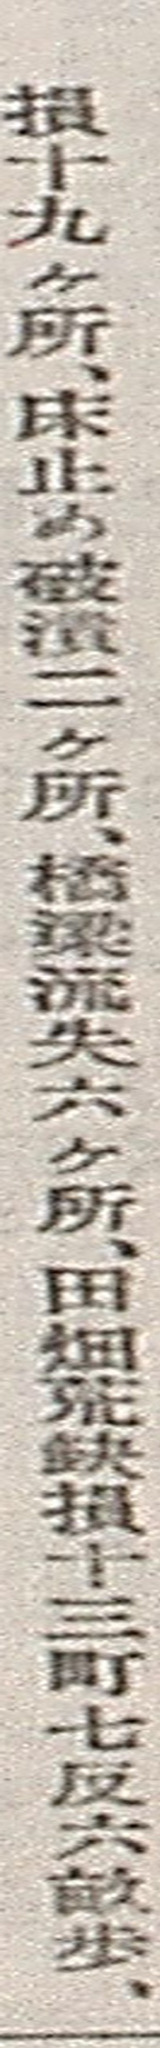損十九ヶ所、床止め破損二ヶ所、橋梁流失六ヶ所、田畑荒缺十三町七反六畝歩、
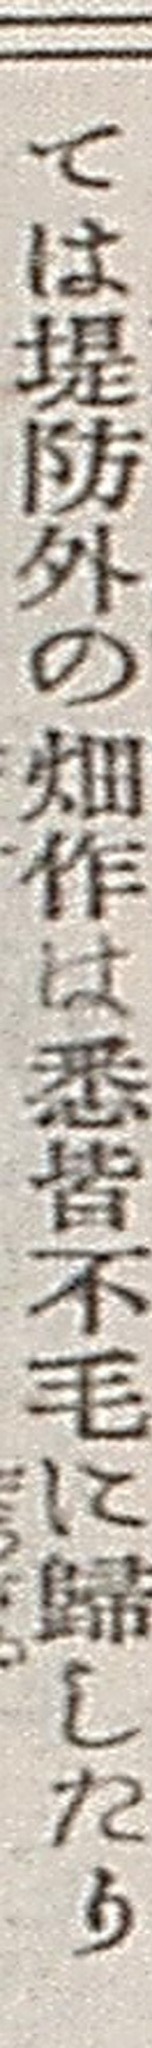ては堤防外の畑作は悉皆不毛に帰したり
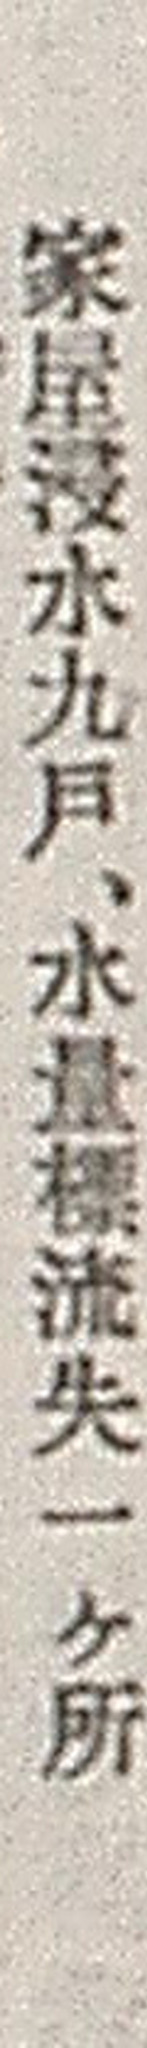家屋浸水九戸、水量標流失一ヶ所
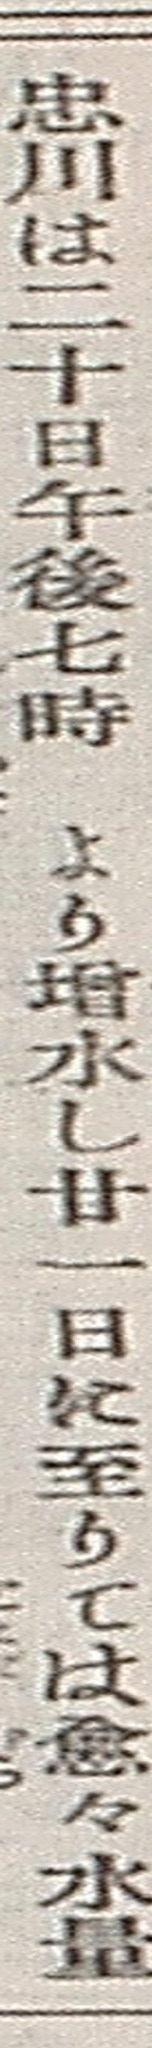忠川は二十日午後七時より増水し廿一日に至りては愈々水量
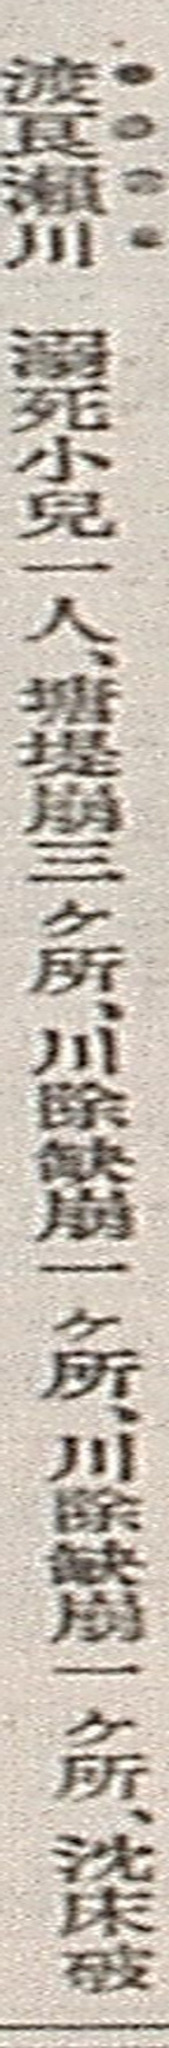渡良瀬川溺死小兒一人、塘提崩三ヶ所、川除缺崩一ヶ所、川除缺崩一ヶ所、沈床破
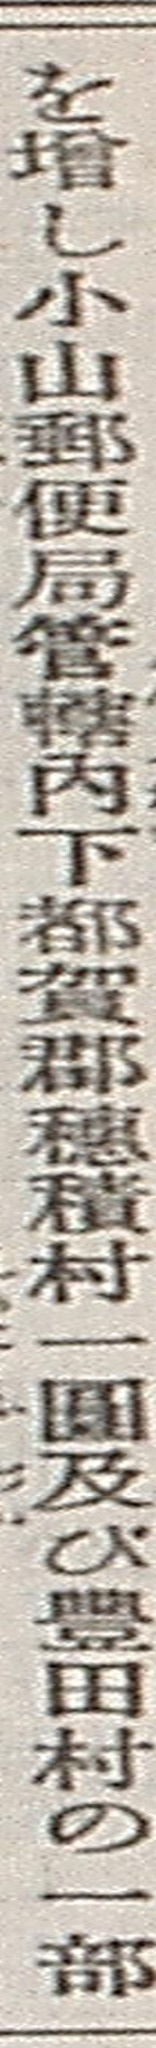を増し小山郵便局管轄内下都賀郡穂積村一円及び豊田村の一部
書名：風俗畫報臨時増刊第百二十八號　洪水被害録（下）
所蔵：東京大学地震研究所図書室 Earthquake Research Institute Library, The University of Tokyo, JAPAN
